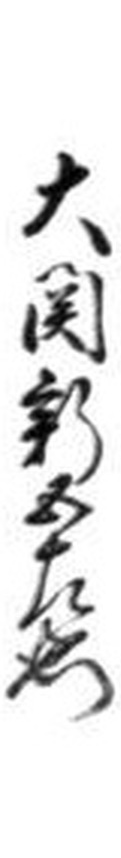大関新五左衛門
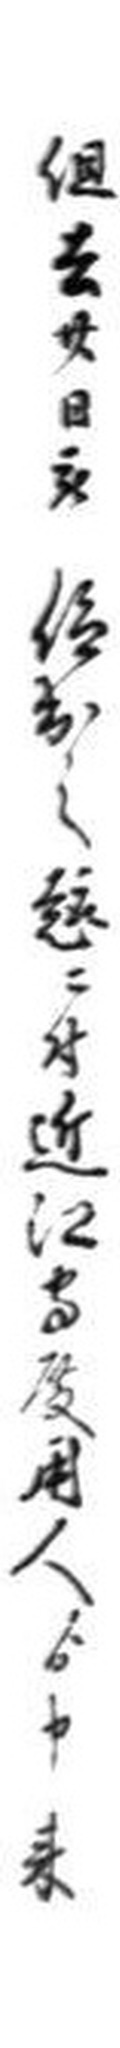但去廿日被仰出之趣ニ付近江守殿用人ゟ申来
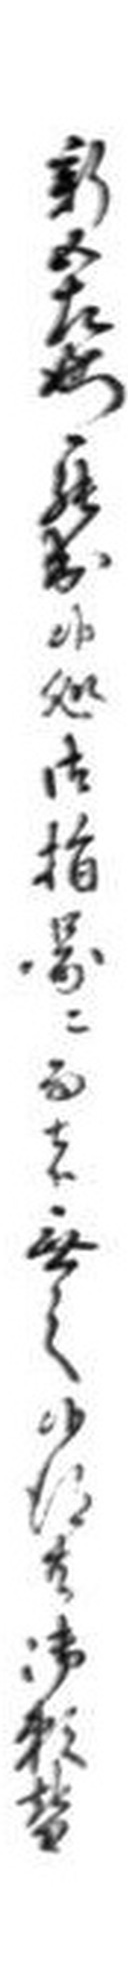新五左衛門罷出候処御指図ニ而者無之候得共御頼替
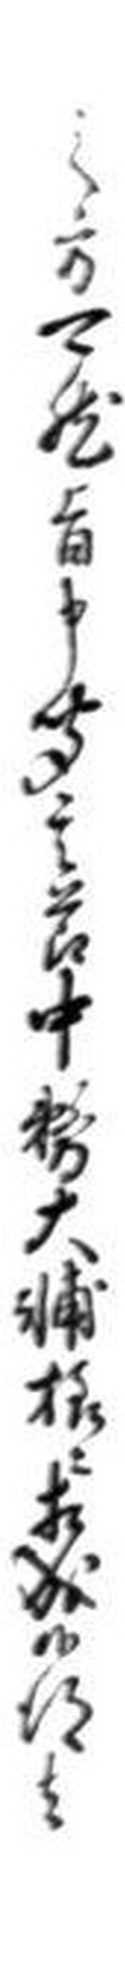之方可然旨申聞其節中務大輔様ニ相成候得者
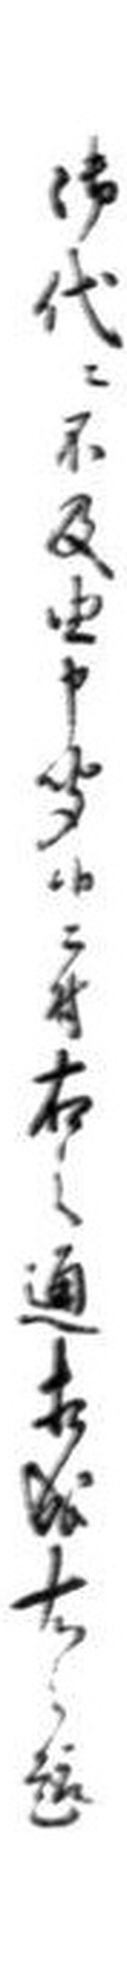御代ニ不及由申聞候ニ付右之通相成右之趣
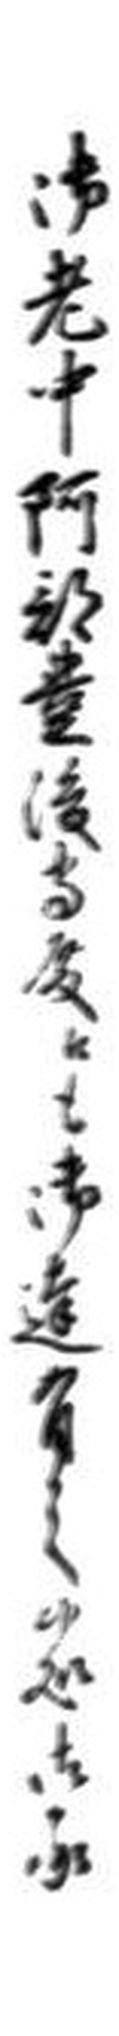御老中阿部豊後守殿江も御達有之候処御承
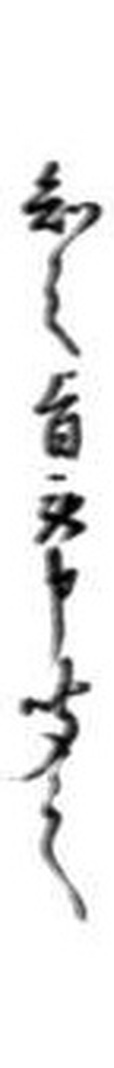知之旨被申聞之
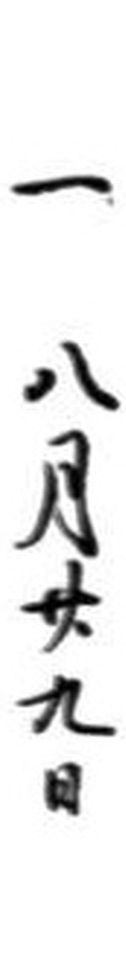一八月廿九日
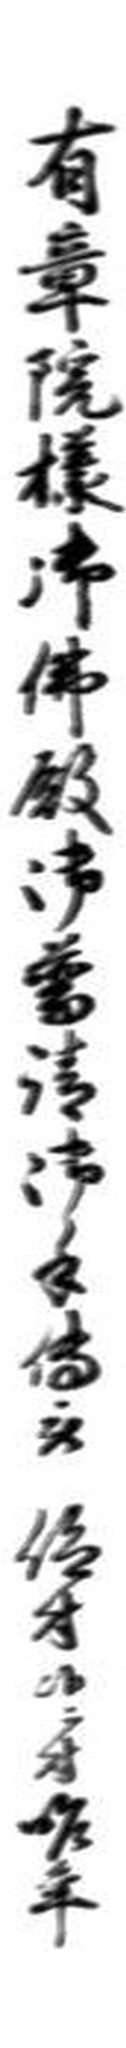有章院様御仏殿御普請御手伝被仰付候ニ付昨年
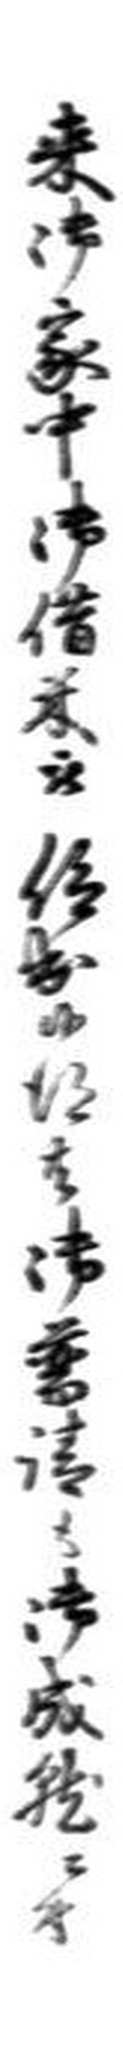来御家中御借米被仰出候得共御普請も御成就ニ付
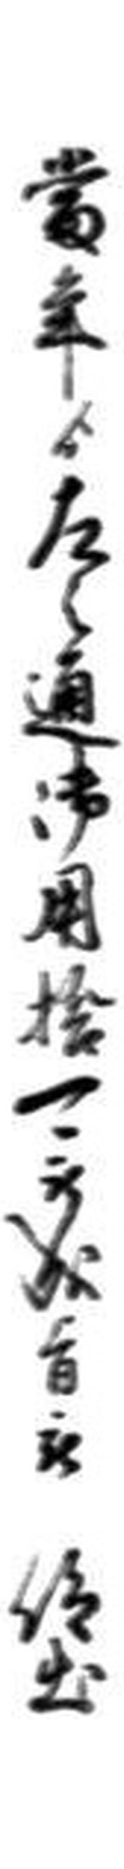当年ゟ左之通御用捨可被成旨被仰出
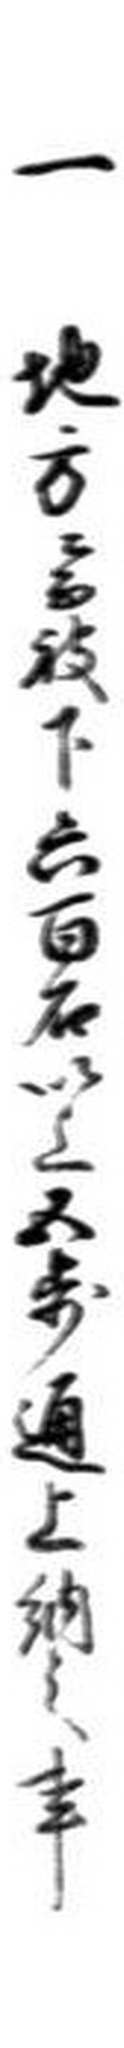一地方ニ而被下六百石以上五歩通上納之事
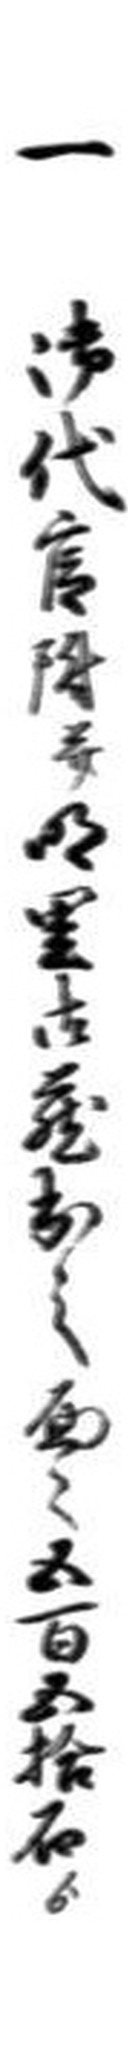一御代官付并明里御蔵出之面々五百五拾石ゟ

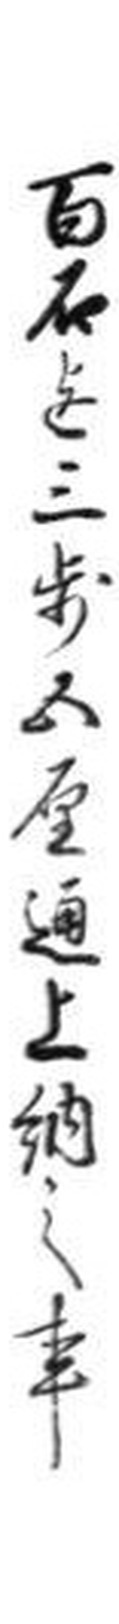百石迄三歩五厘通上納之事
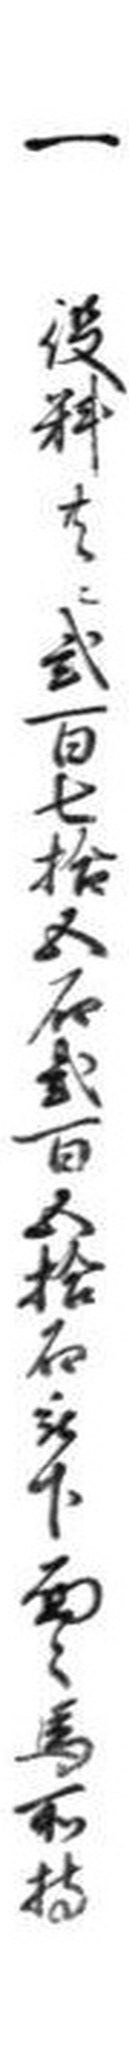一役料共ニ弐百七拾五石弐百五拾石被下面々馬所持
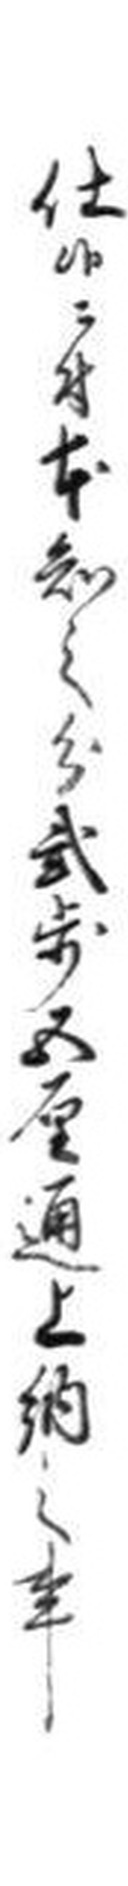仕候ニ付本知之分弐歩五厘通上納之事
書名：家譜 三十二 吉邦公 従享保二年到享保三年
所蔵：福井県文書館 Fukui Prefectural Archives
